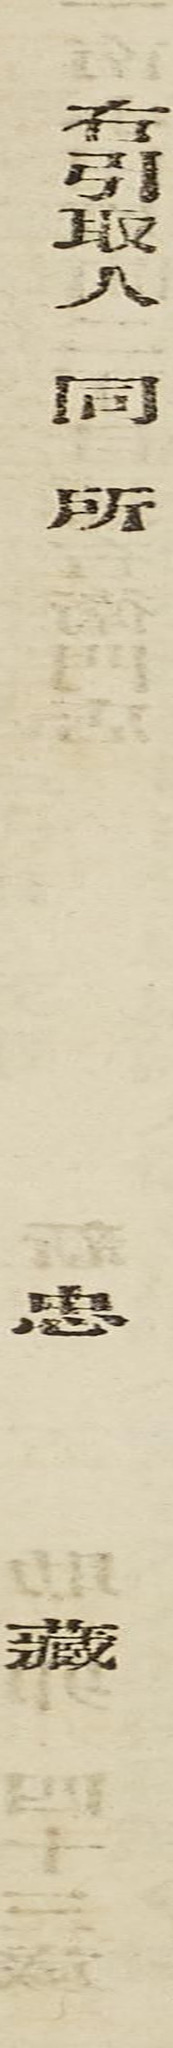右引取人同所忠蔵
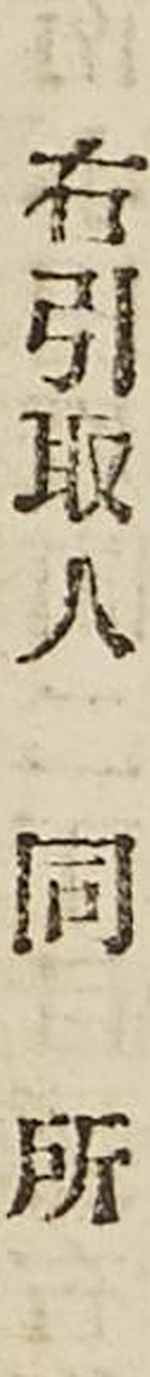右引取人同同
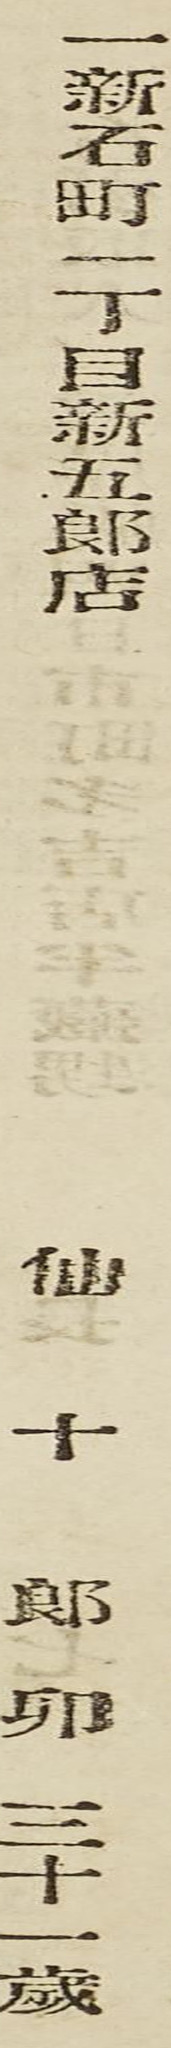一新石町一丁目新五郎店仙十郎卯三十一歳
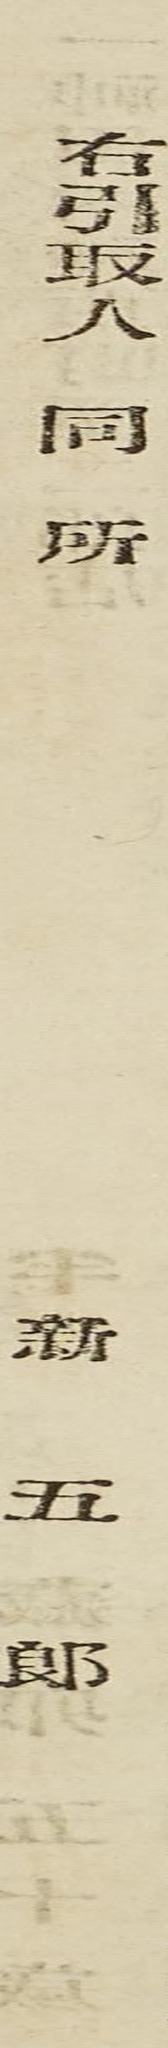右引取人同所新五郎
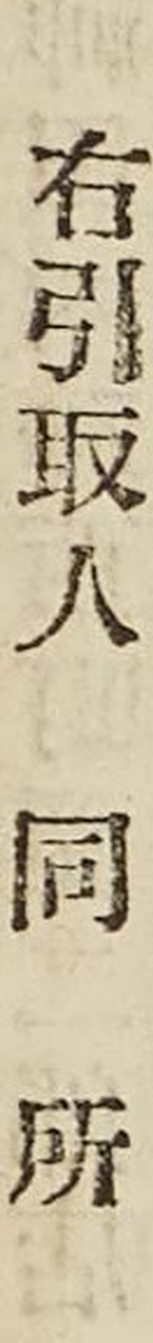右引取人同同
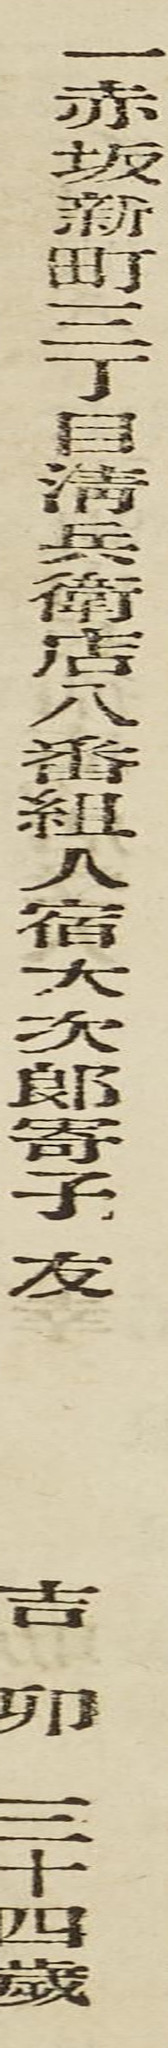一赤坂新町三丁目清兵衛店八番組人宿大次郎寄子友吉卯三十四歳
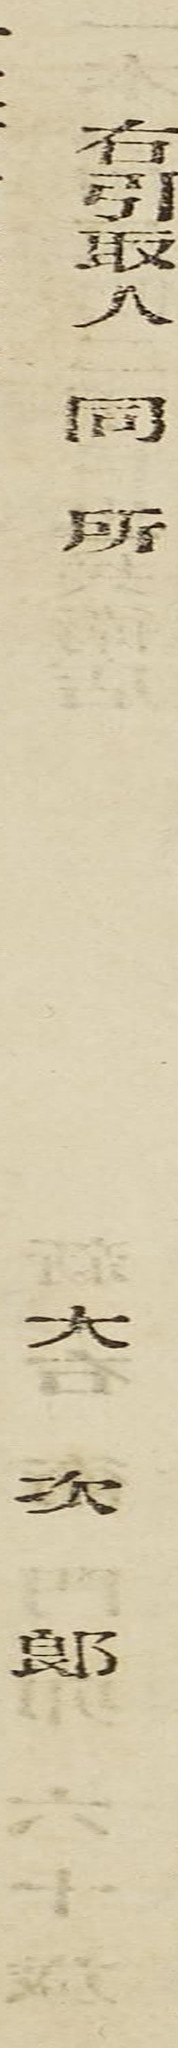右引取人同所大次郎
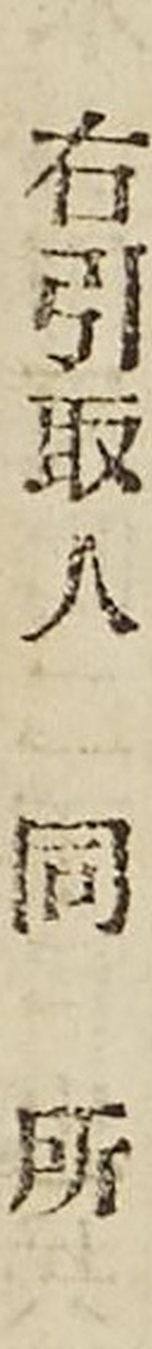右引取人同同
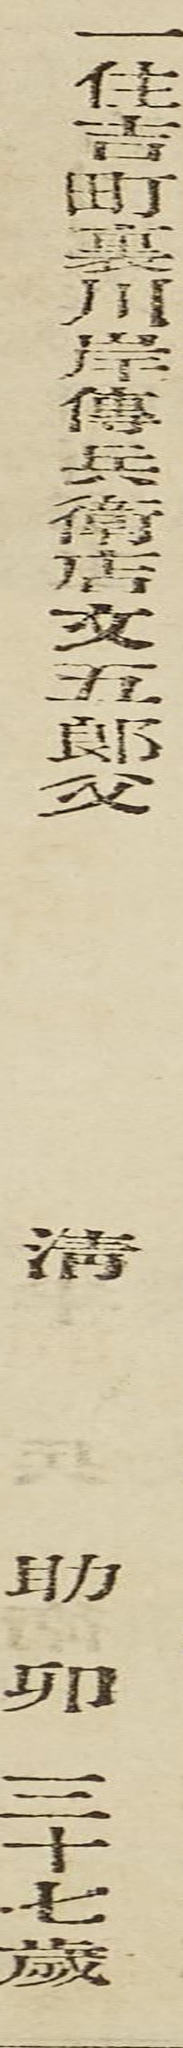一住吉町裏川岸傳兵衛店文五郎父清助卯三十七歳
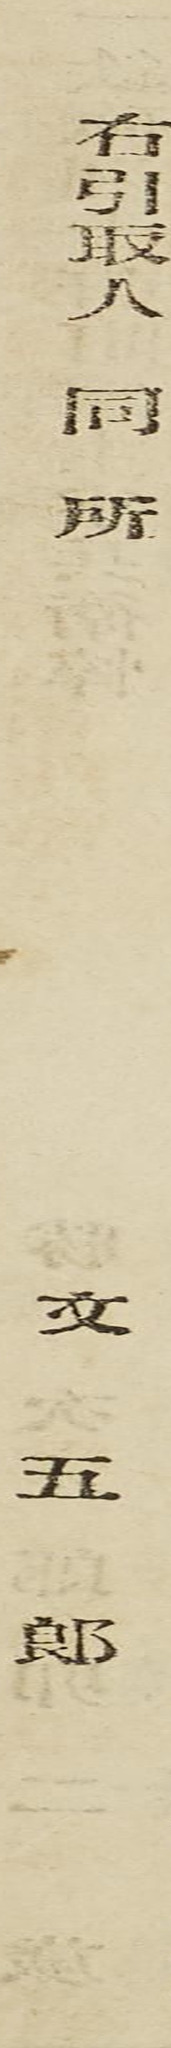右引取人同所文五郎
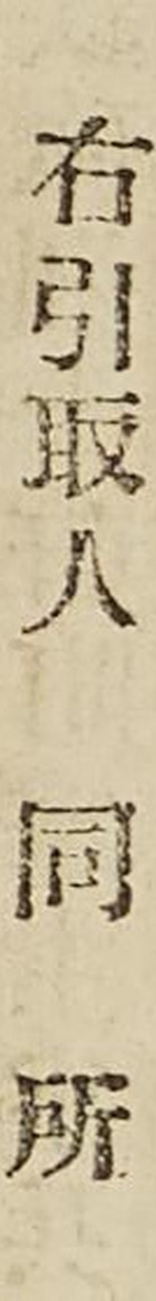右引取人同同

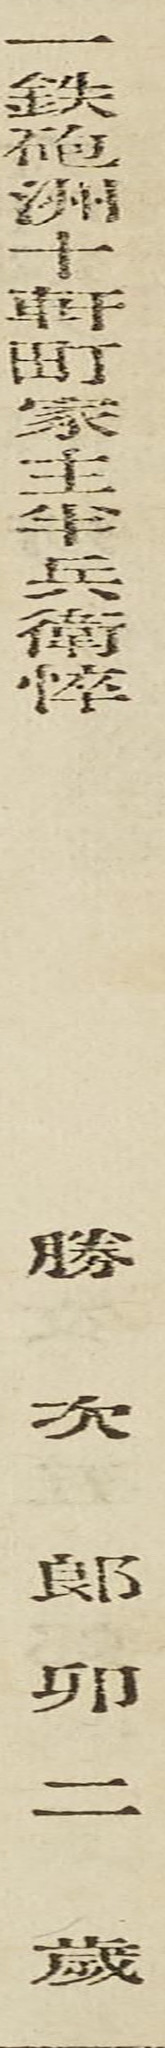一鉄砲洲十軒町家主半兵衛倅勝次郎卯二歳
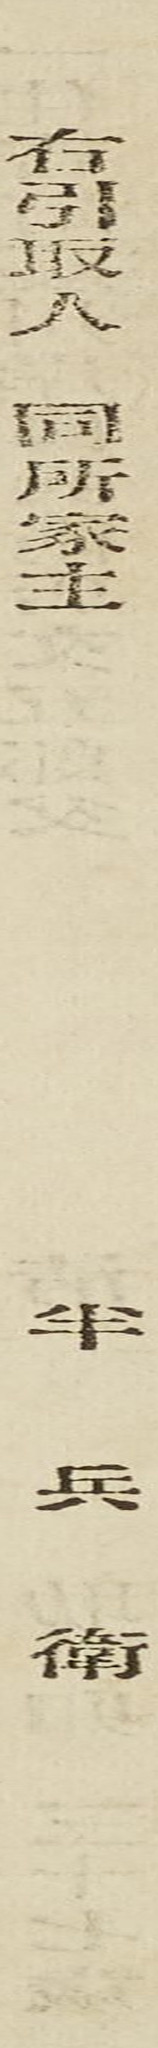右引取人同所家主半兵衛
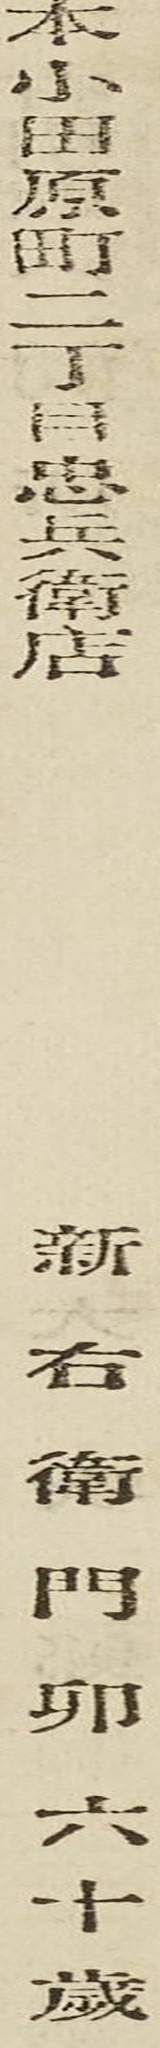一本小田原町二丁目忠兵衛店新右衛門卯六十歳
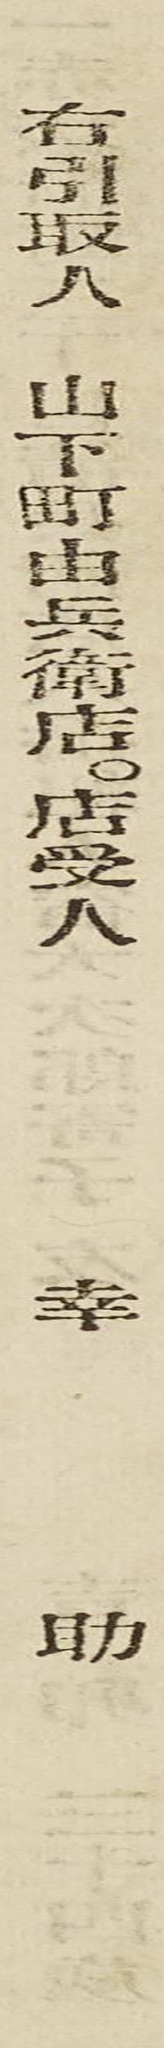右引取人山下町由兵衛店○店受人幸助
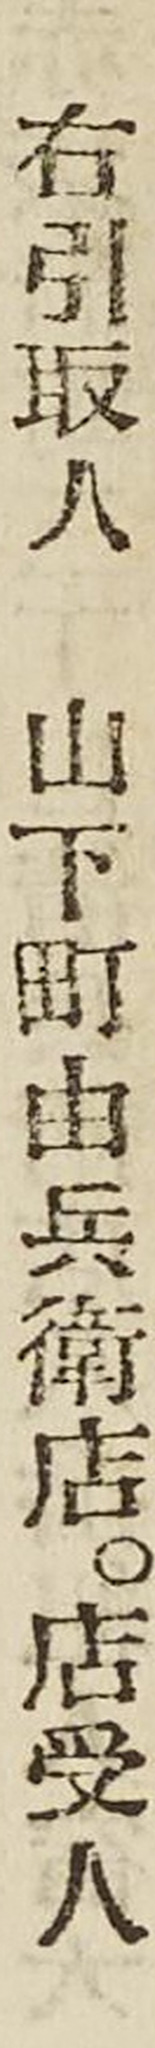右引取人山下町由兵衛店○店受人幸助
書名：永代惨話　文化の夢　全
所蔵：東京大学地震研究所図書室 Earthquake Research Institute Library, The University of Tokyo, JAPAN
